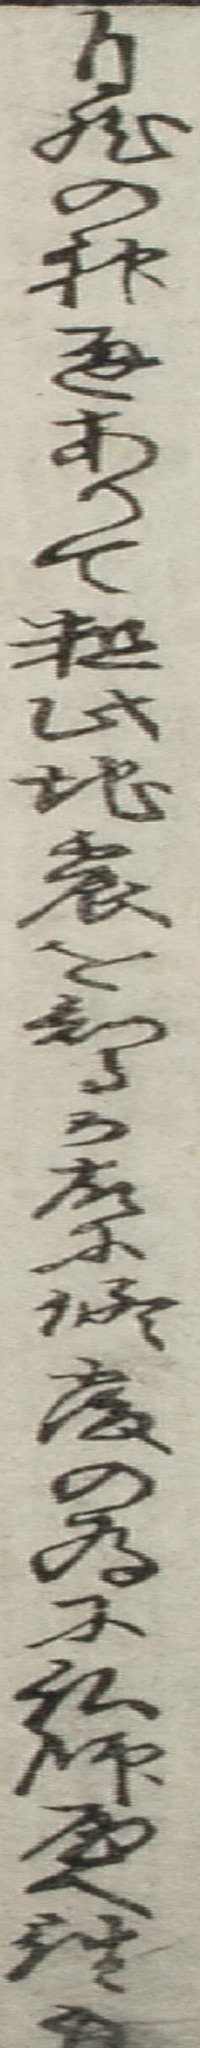自然の神通ありて粗此地震を知るか故に修覆の為に仏師屋へ往も
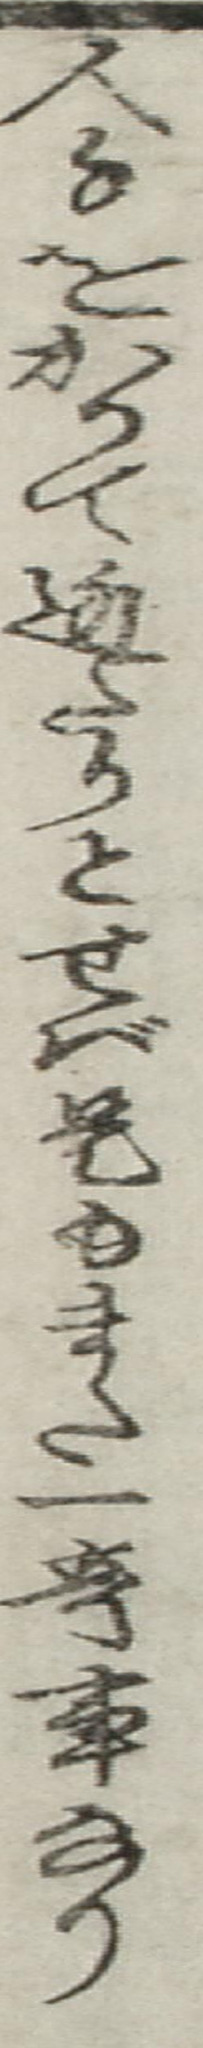人手をかりて逃たりとせば是もまた一奇事なり
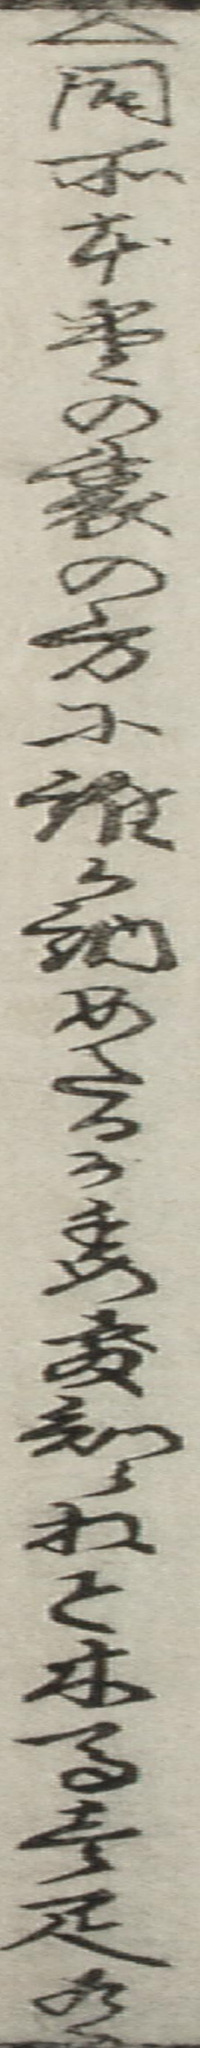△同所本堂の裏の方に誰か納めたるか委敷知らねと木馬壱疋有
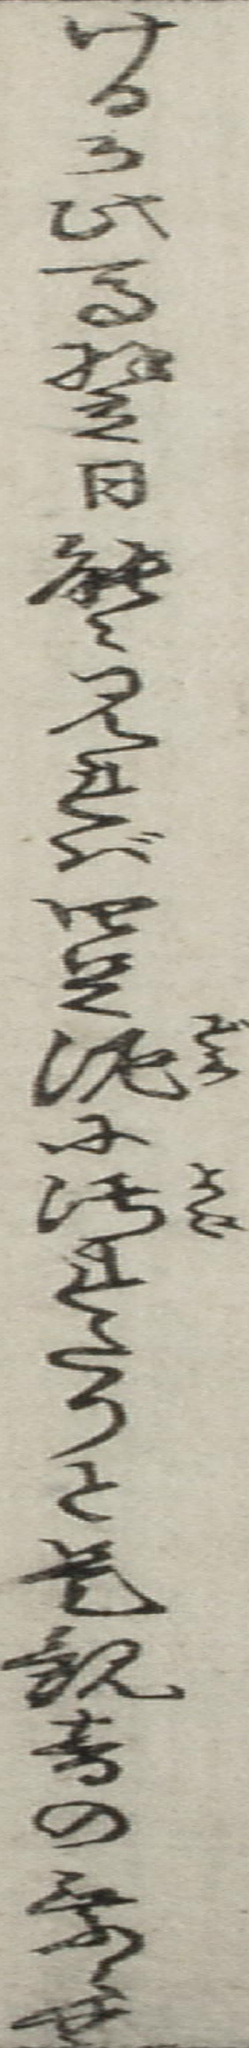けるか此馬翌日能々見れば四足泥に汚れたりと是観音の乗らせ
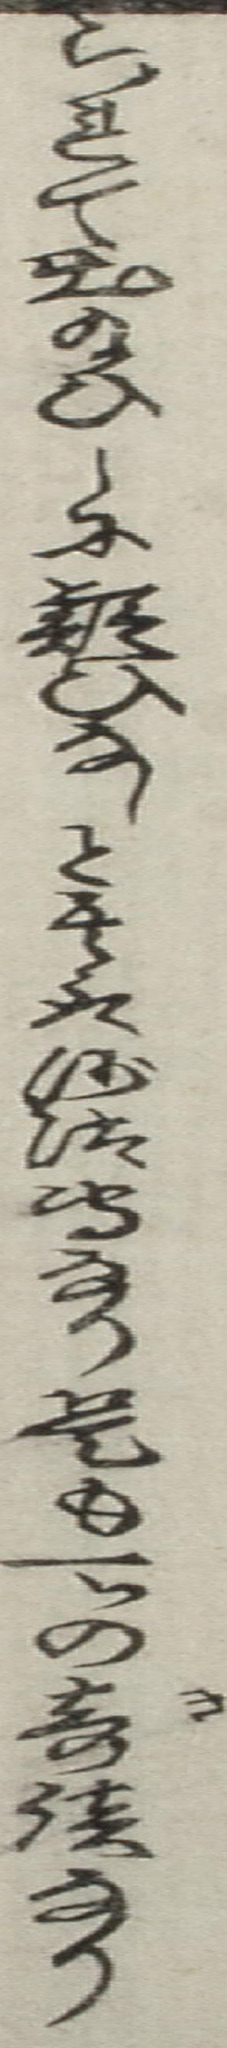られて出給ひしに疑ひなしと其取沙汰専なり是も一ツの奇談なり
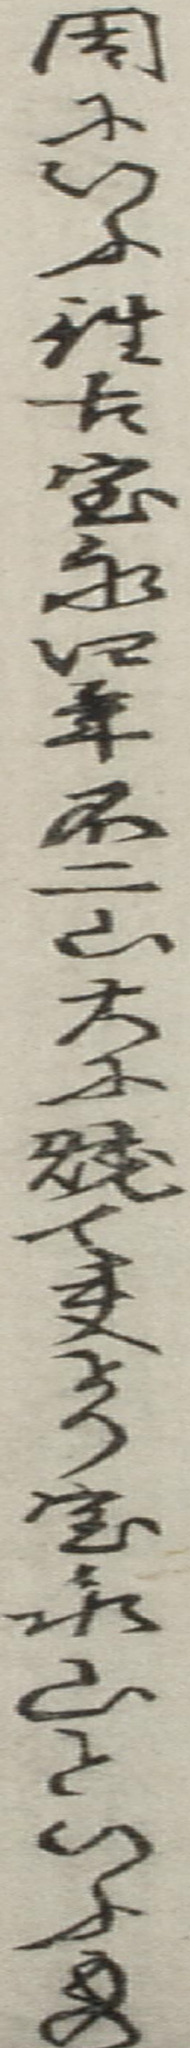因にいふ往古宝永四年不二山大に焼て夫より宝永山といふもの
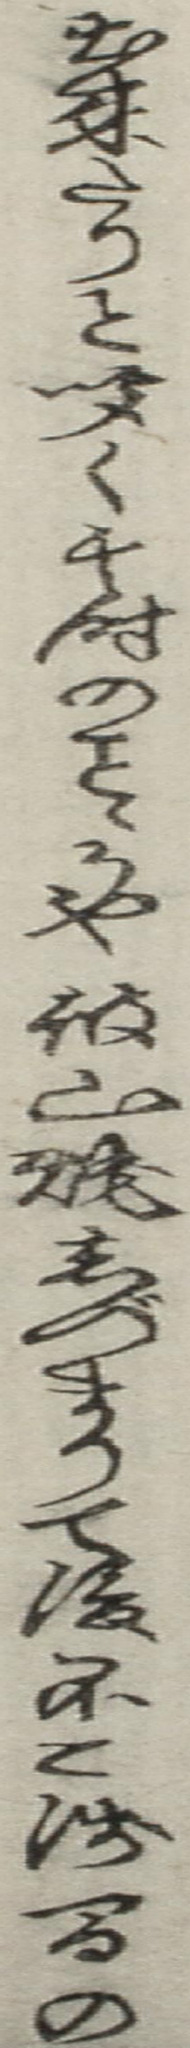出来たりと聞く其時のことゝかや彼山焼しづまりて後不二浅間の
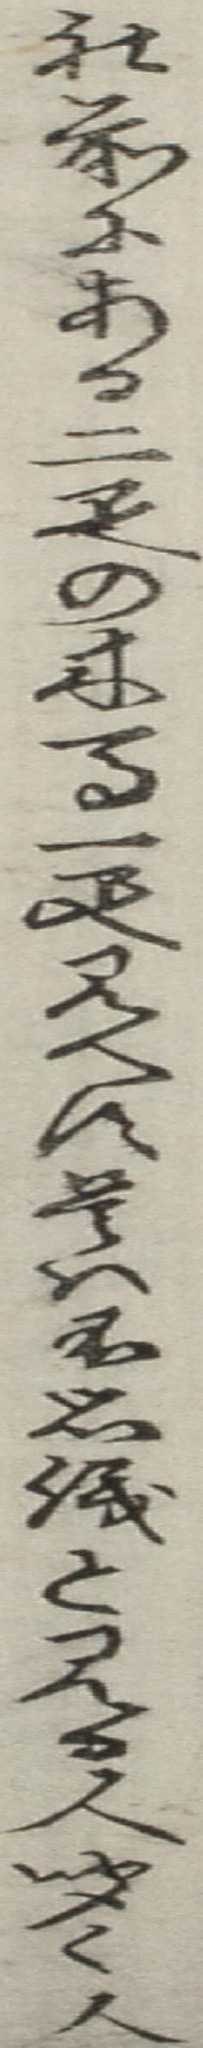社前にある二疋の木馬一疋見へす是は不思議と見る人聞く人
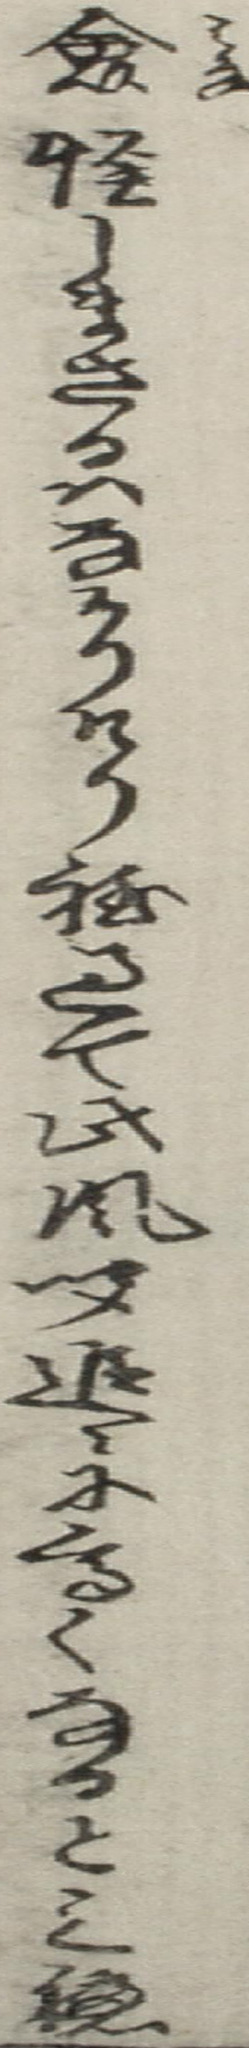僉怪しまさるはなかりけり程過て此風聞追々に高くなると三穂
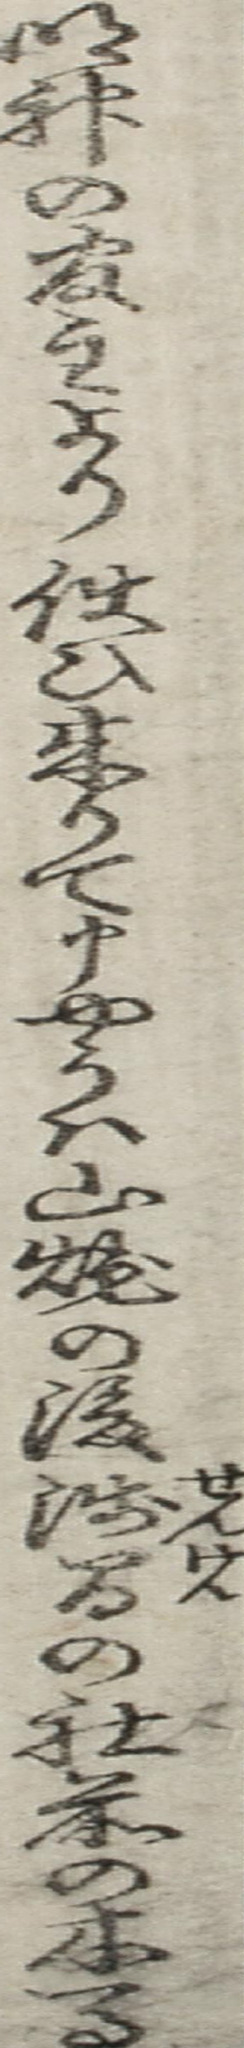明神の官主より使ひ来りて申やうは山焼の後浅間の社前の木馬
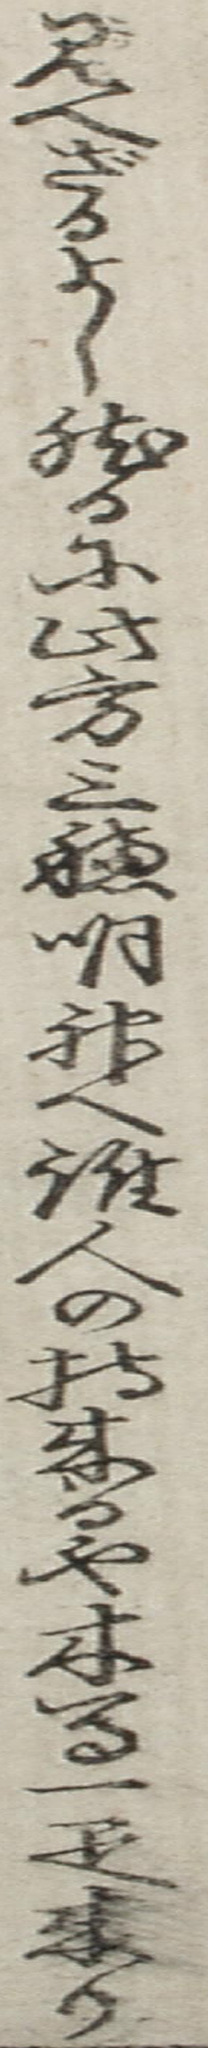見へざるよし然るに此方三穂明神へ誰人の持来るや木馬一疋来り
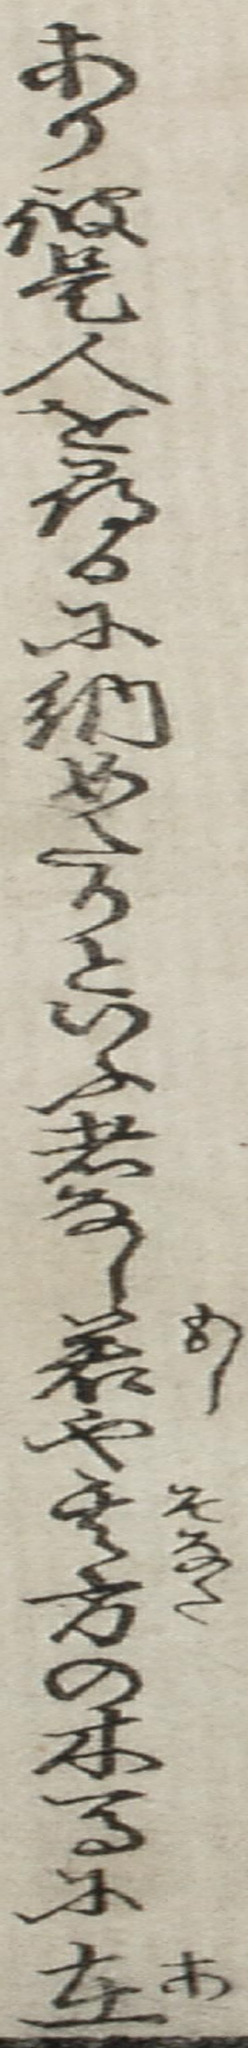あり彼是人を尋るに納めたりといふ者なし若や其方の木馬に在
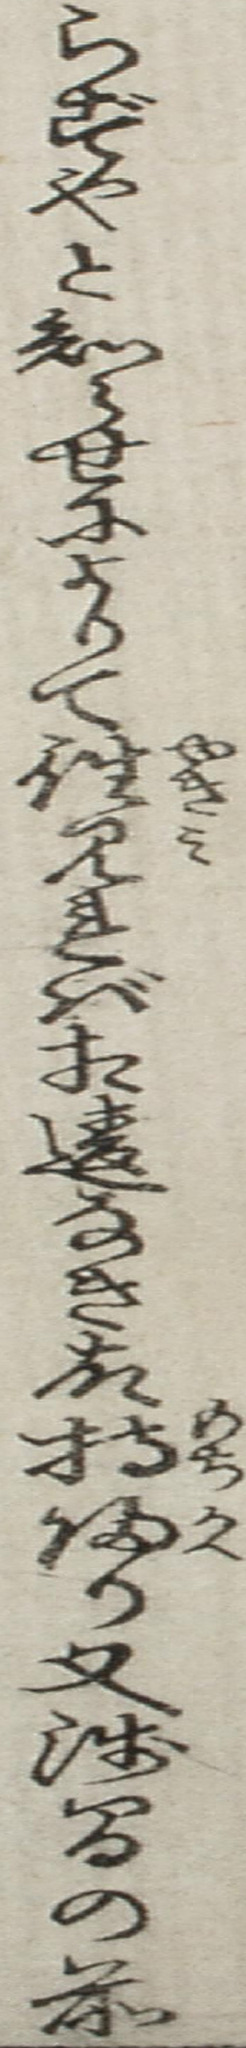らずやと知らせによりて往見れば相違なき故持帰り又浅間の前
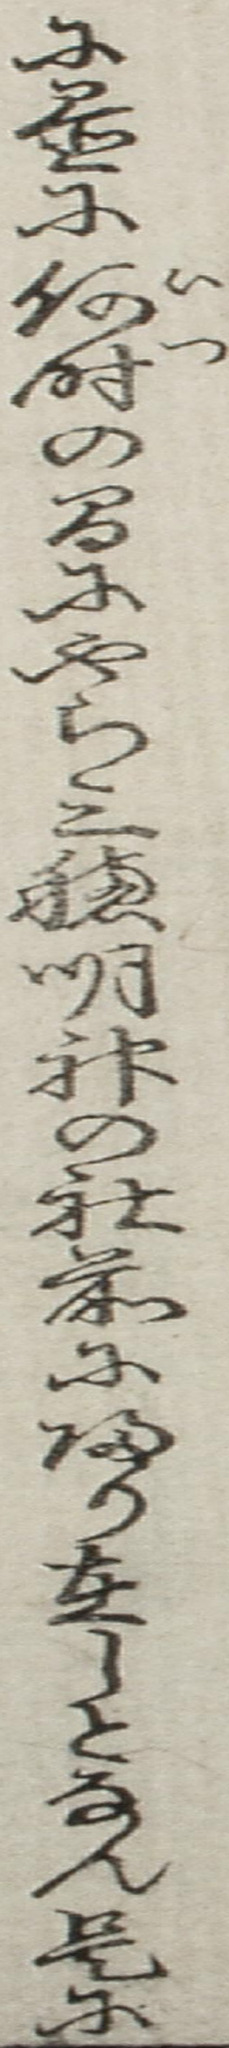に置に何時の間にやら三穂明神の社前に帰り在しとなん是に
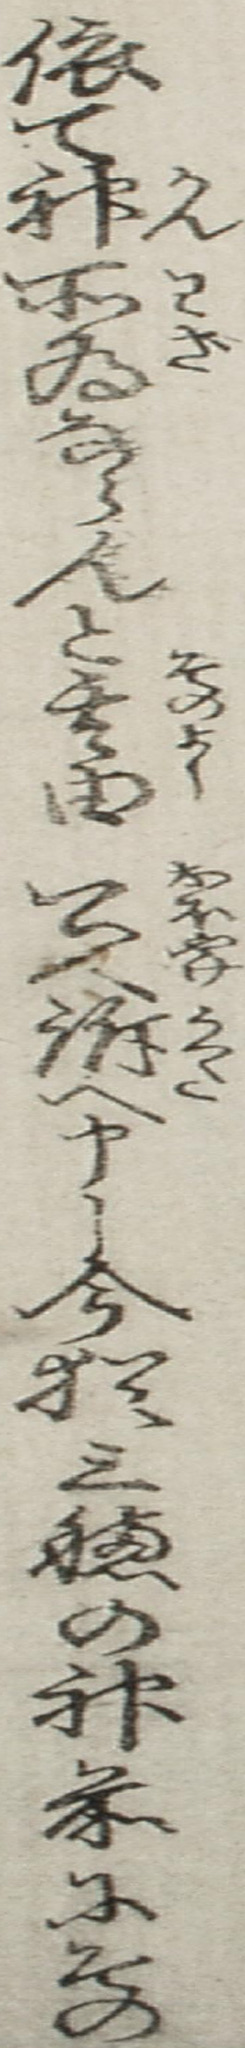依て神所為ならんと其由公へ訴へ申し今猶三穂の神前にその
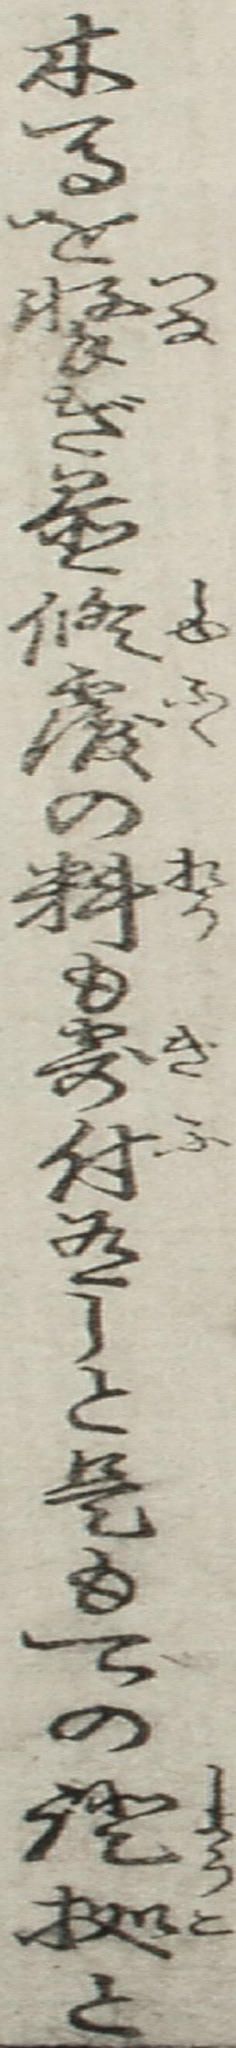木馬を繋ぎ置修覆の料も寄付有しと是も一つの証拠と
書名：安政見聞誌　下
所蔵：東京大学地震研究所図書室 Earthquake Research Institute Library, The University of Tokyo, JAPAN
